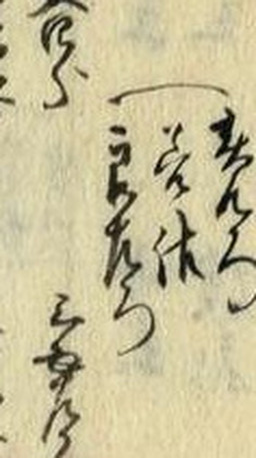良左衛門
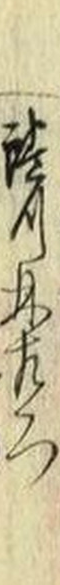蜷川林左衛門
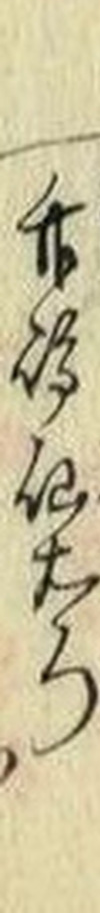竹嶋仙右衛門
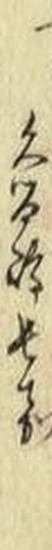久留嶋長嘉
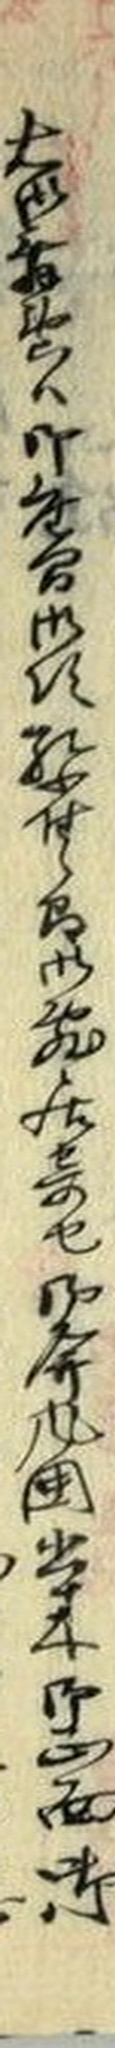右御舞台ハ御座間御次孔雀之間御敷居寄セ御屛風囲出来御正面御
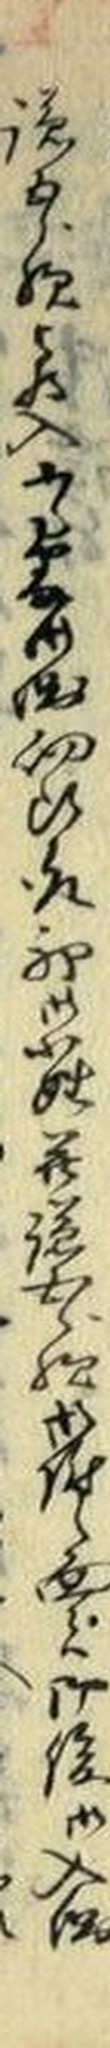謙五郎様被為入当番御側向頭取初御小姓幷謙五郎様御附之面々ハ御後御入側
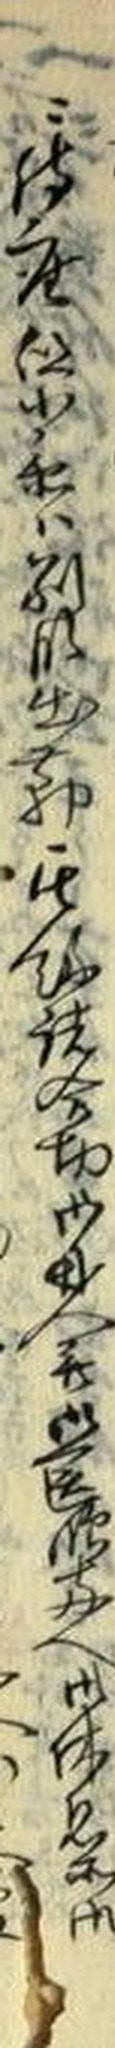ニ侍座但小兵衛ハ別段出勤其余詰合切御用人幷御医師両人御休息所御
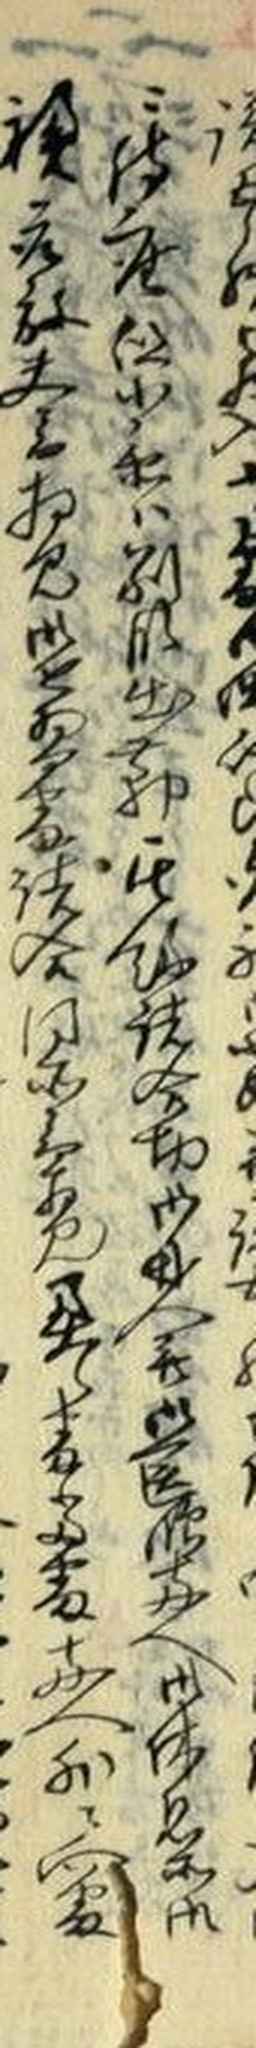襖取放夫ニ而拝見御近習番詰合同所ニ而拝見奥之番当番両人外ニ向番
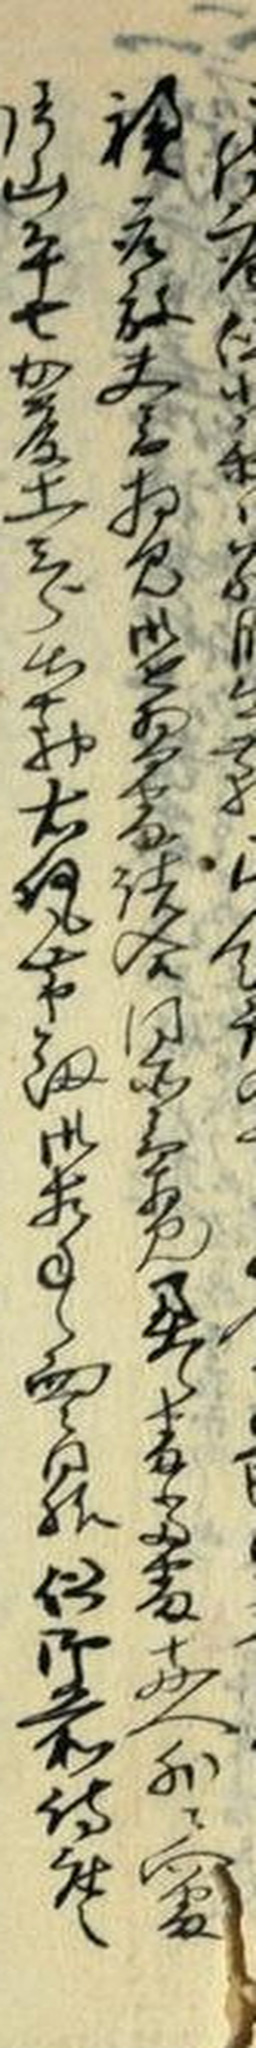片山平七加藤土三郎出勤右何も帯剣御相手之面々同様但御前侍座之
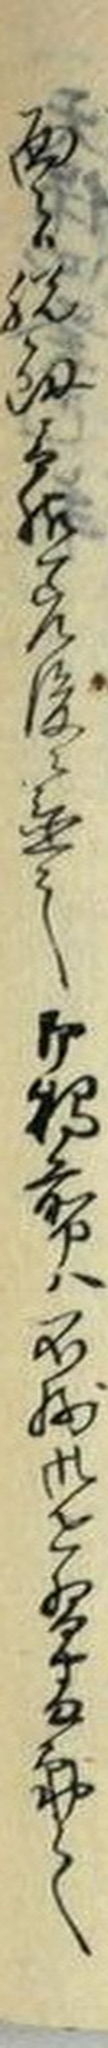面々ハ脱剣ニ而脇差後ニ置之御掲剪ハ不残御近習番勤之
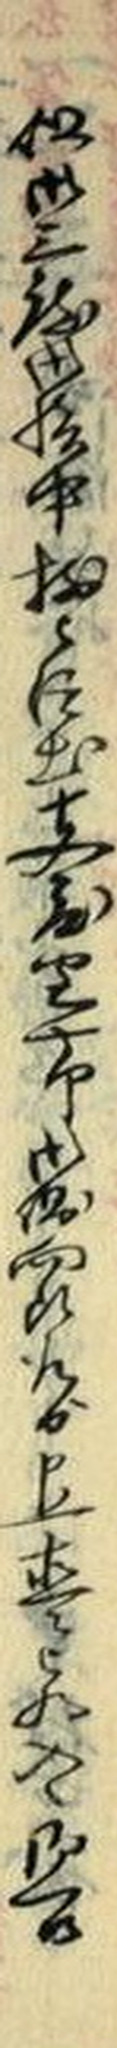但御三度御膳中揃被仰出支度宜節御側向頭取ゟ申上直ニ被為入候御召
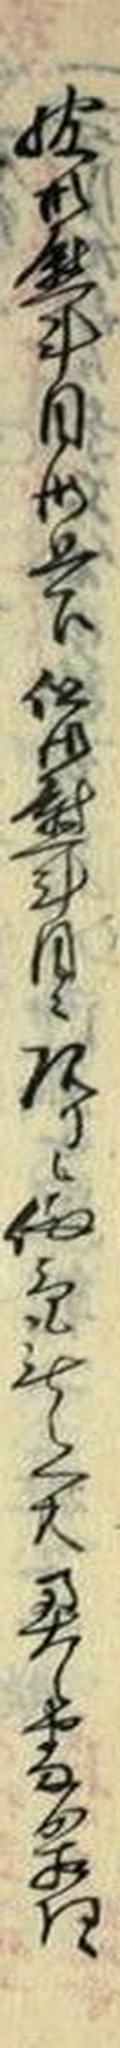服御熨斗目御上下但御熨斗目ニ限り之儀ニ而も無之候へ共奥之番ゟ相伺候
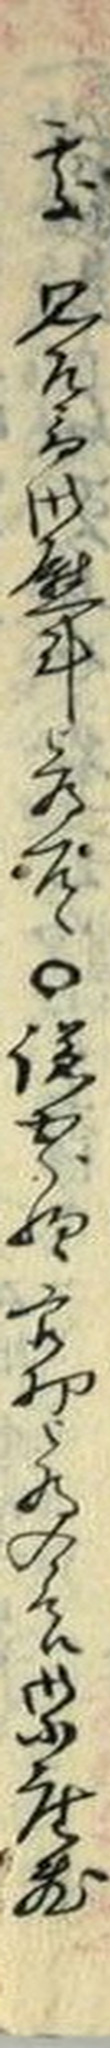処思召ニ而御熨斗被為召候〇謙五郎様最初被為入候節御小座敷
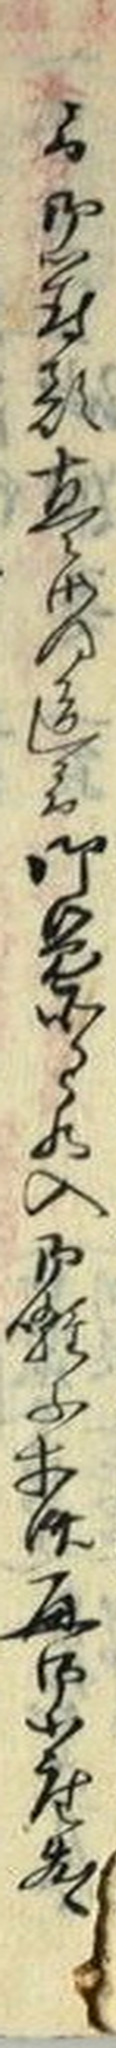ニ而御対顔直ニ御同道ニ而御覧所へ被為入御囃子相済再御小座敷へ
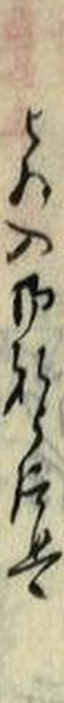被為入御礼被仰上候
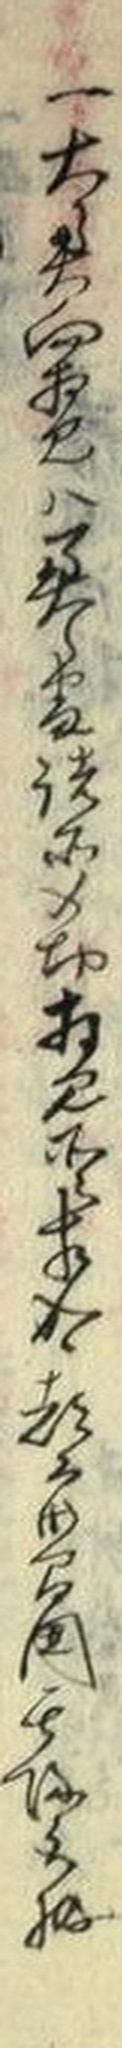一大奥向拝見ハ奥之番詰所〆切拝見所ニ相成候都而御間囲其際取扱
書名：少傅日録抄（斉承付側向頭取日記、在国）
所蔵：福井県文書館 Fukui Prefectural Archives
